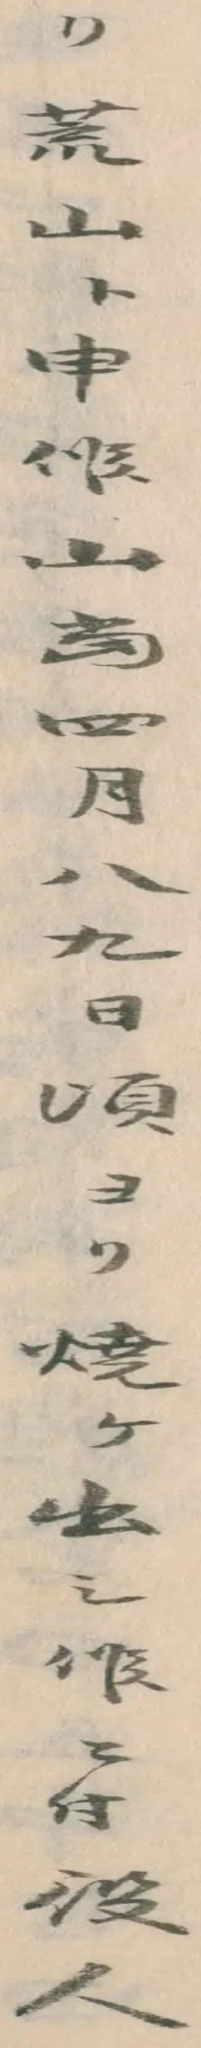リ荒山ト申候山当四月八九日頃ヨリ焼ケ出シ候ニ付役人

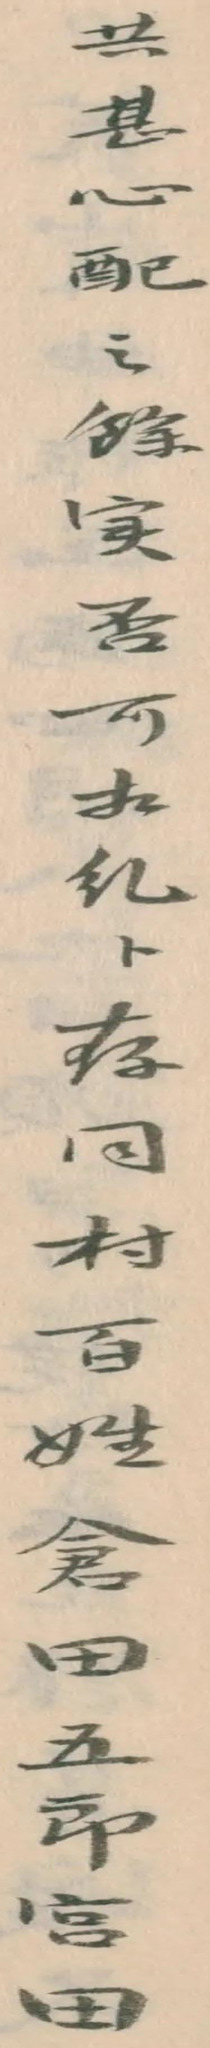共甚心配之余実否可相糺ト存同村百姓倉田五郎宮田
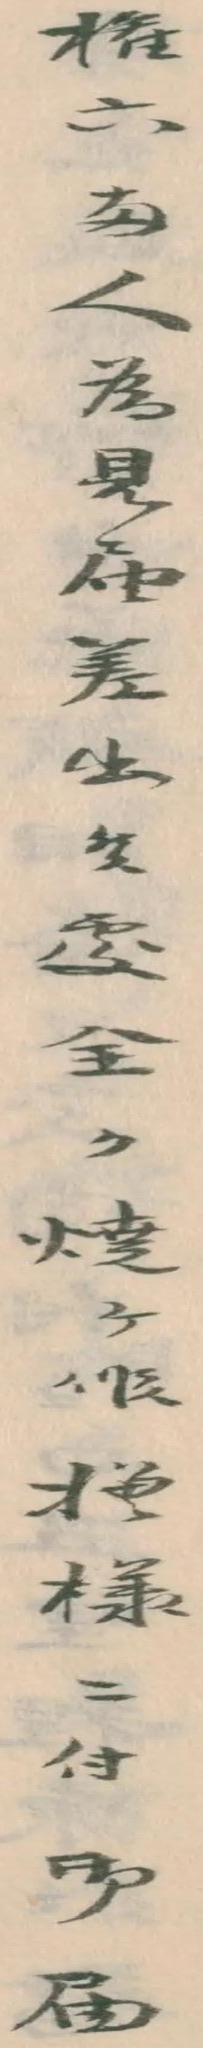権六両人為見届差出候処全ク焼ケ候模様ニ付御届
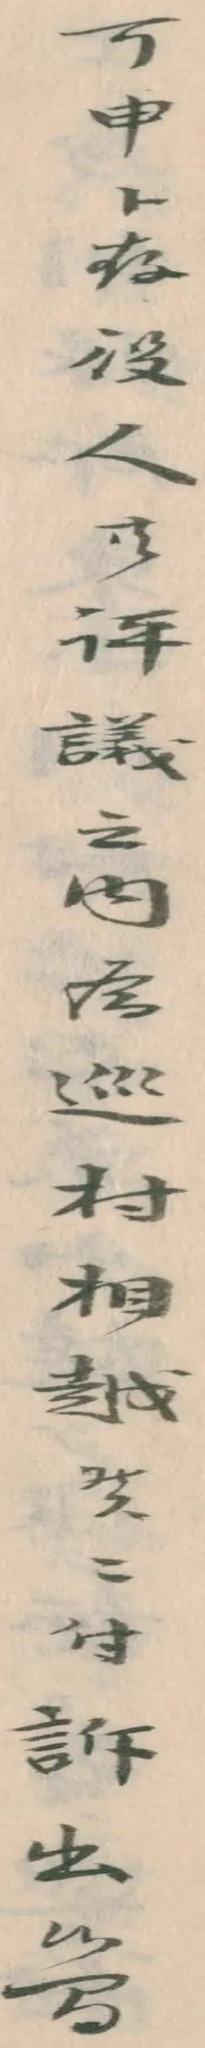可申ト存役人共評議之内為巡村相越候ニ付訴出候間
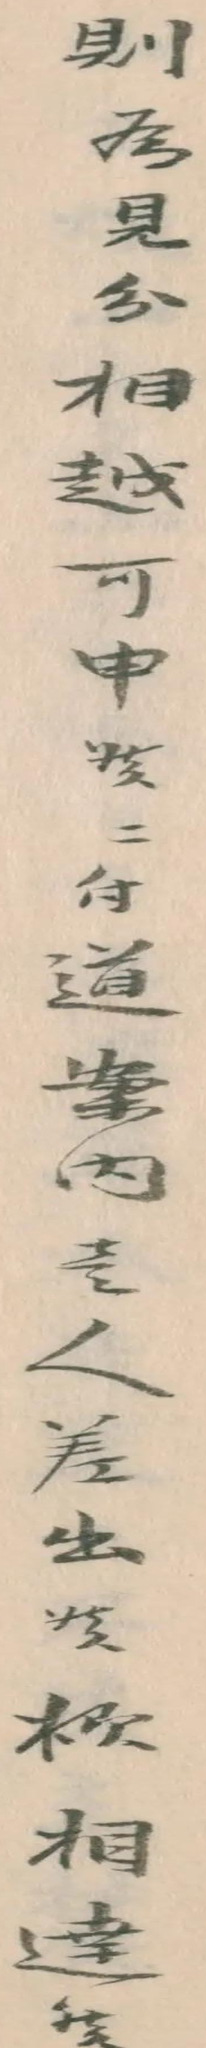則為見分相越可申候ニ付道案内壱人差出候様相達候
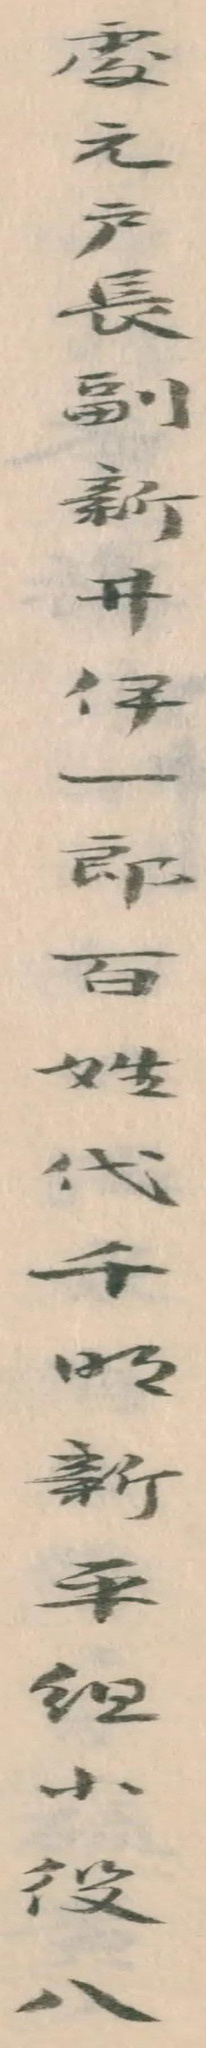処元戸長副新井伊一郎百姓代千明新平組小役八
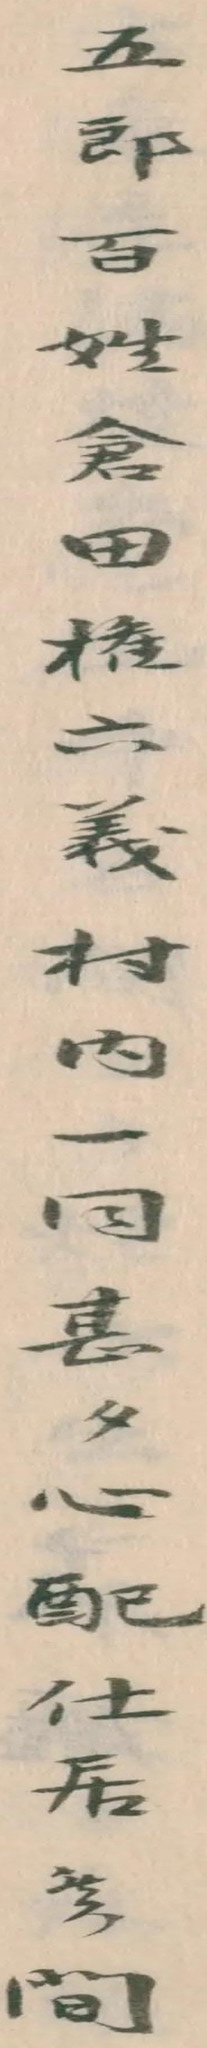五郎百姓倉田権六義村内一同甚タ心配仕居候間
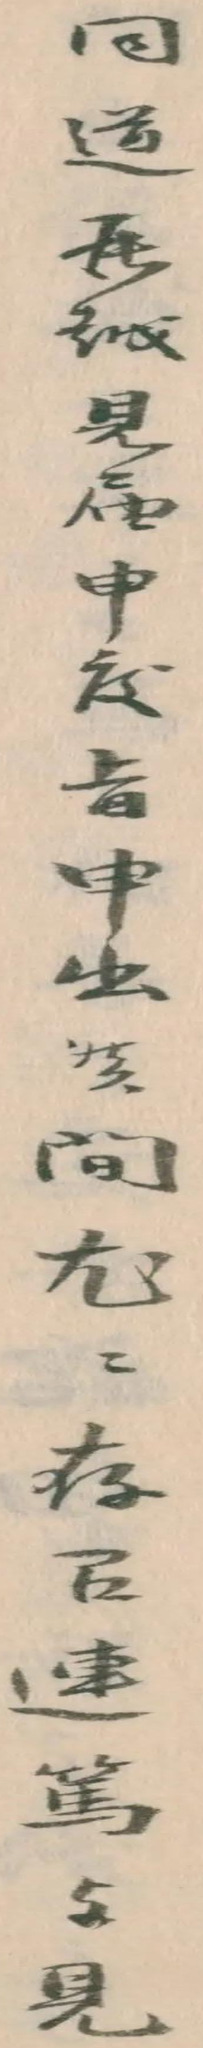同道罷越見届申度旨申出候間尤ニ存召連篤ト見
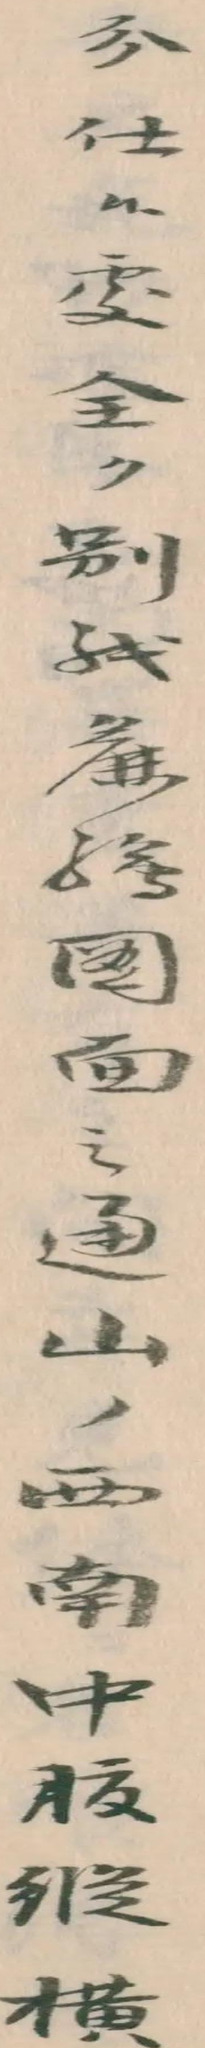分仕候処全ク別紙麁絵図面之通山ノ西南中腹縦横
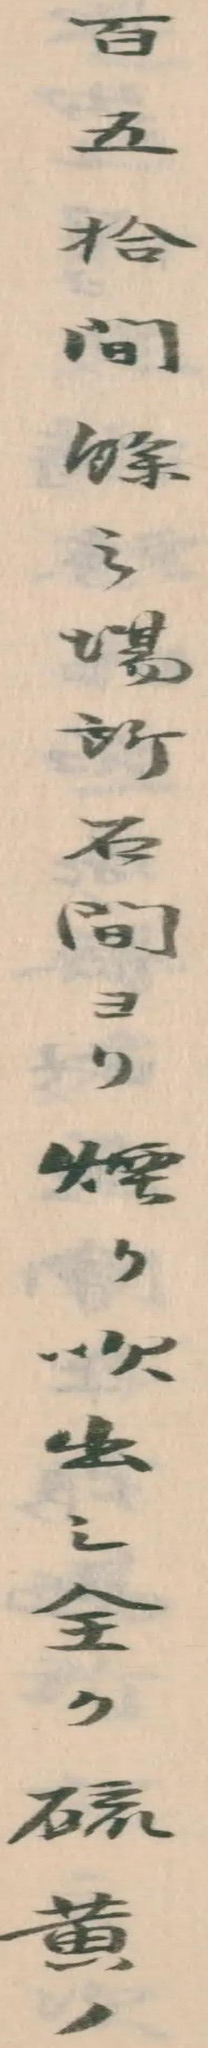百五拾間余之場所石間ヨリ煙リ吹出シ全ク硫黄ノ
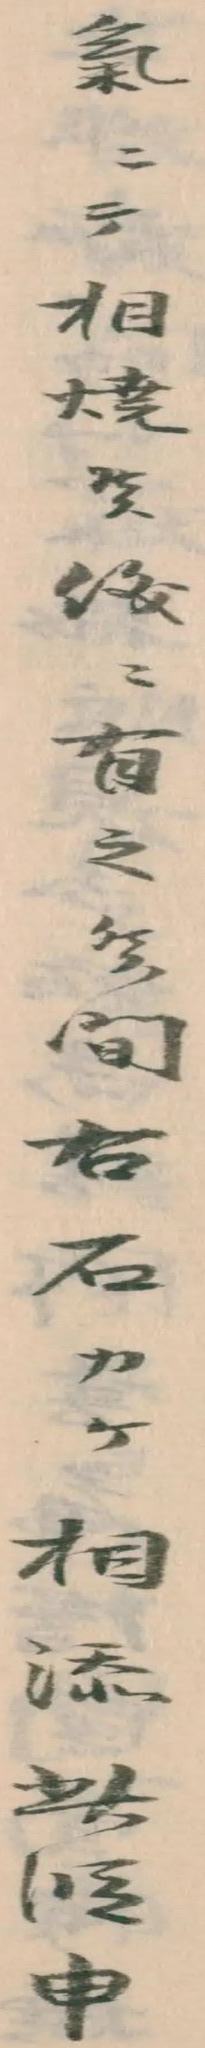気ニテ相焼候儀ニ有之候間右石カケ相添此段申
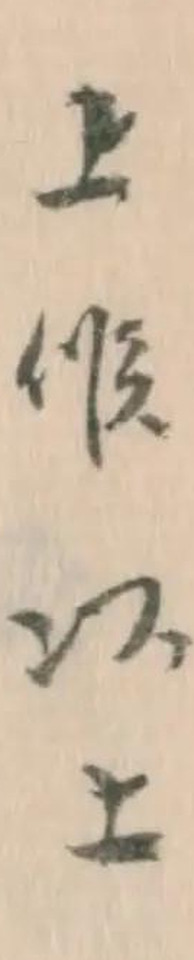上候以上
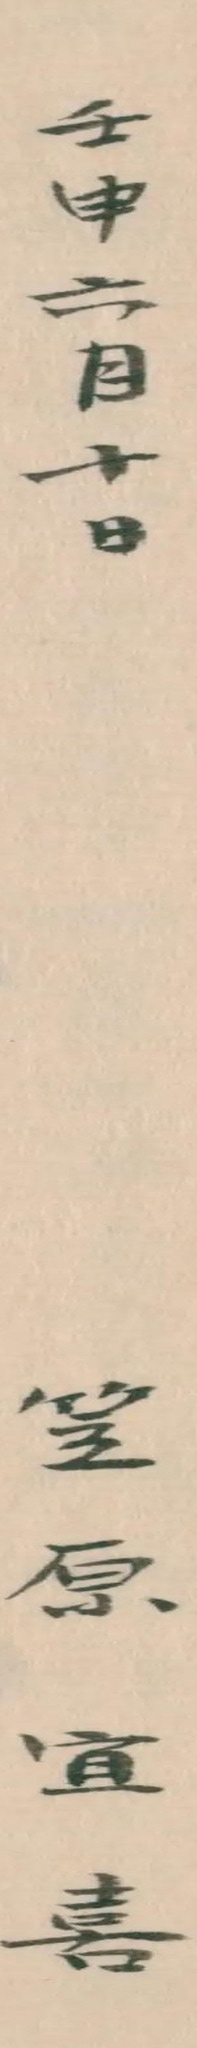壬申六月十日笠原宣喜
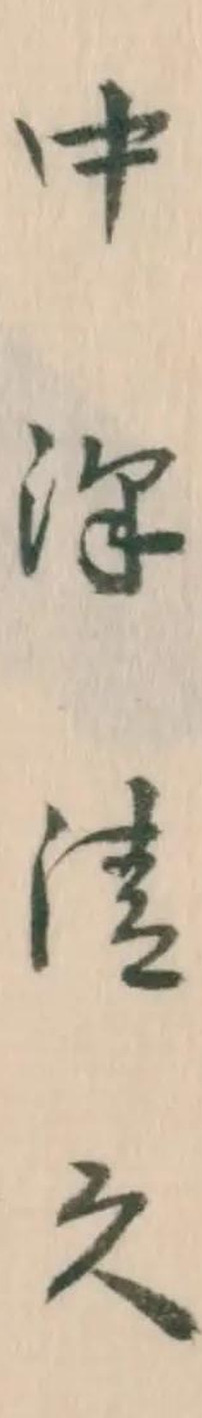中澤清久
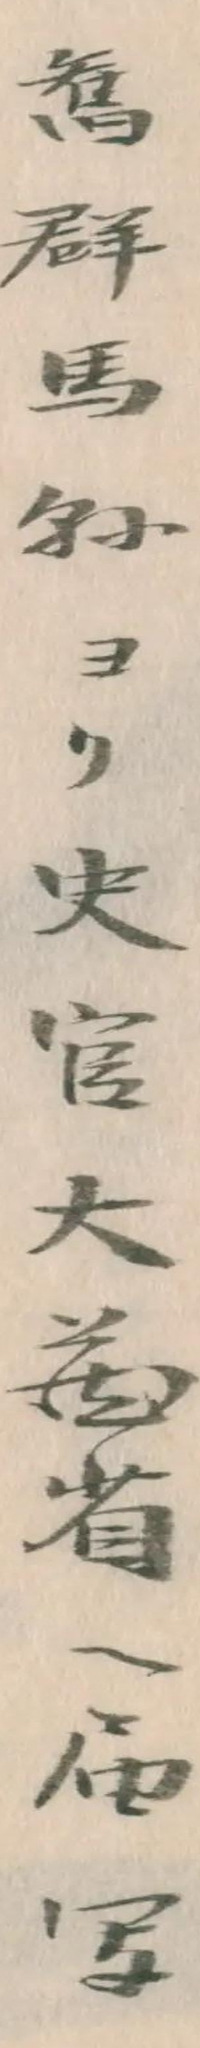旧群馬県ヨリ吏官大蔵省ヘ届写
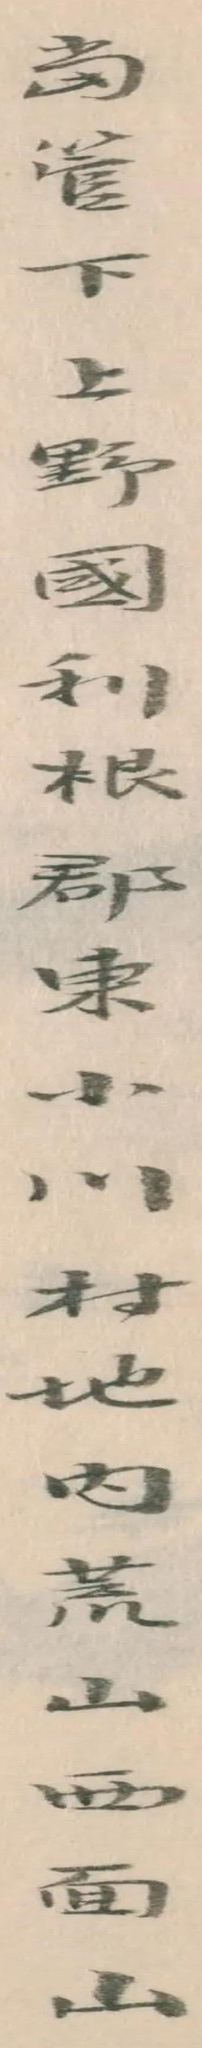当管下上野国利根郡東小川村地内荒山西面山
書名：地災撮要. 巻11-12(地震之部)
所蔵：国立国会図書館 National Diet Library, JAPAN
